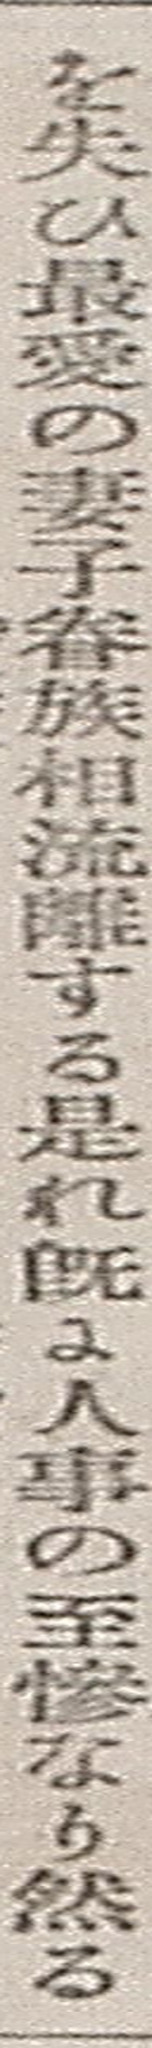を失ひ最愛の妻子眷属相流離する是れ既に人事の至惨なり然る
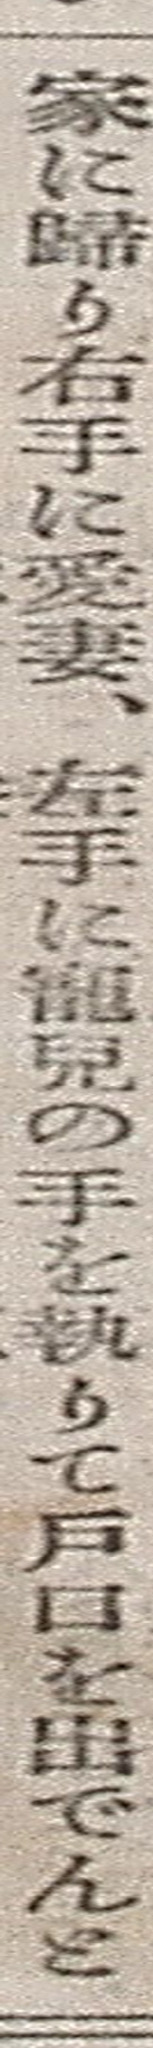家に帰り右手に愛妻、左手に寵児の手を執りて戸口を出でんと
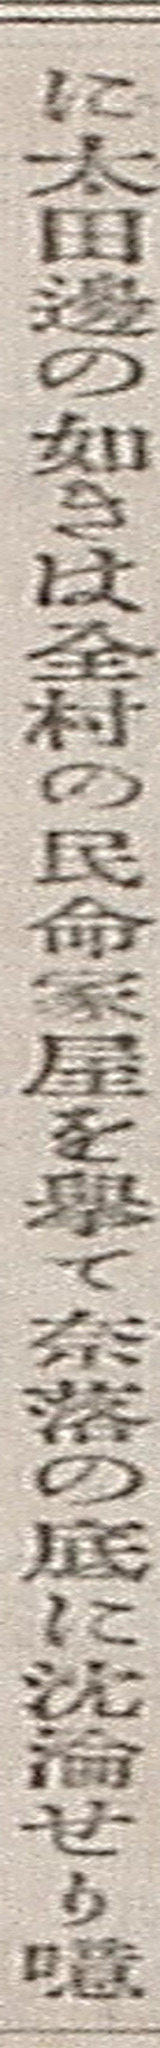に太田辺の如きは全村の民命家屋を挙て奈落の底に沈淪せり噫
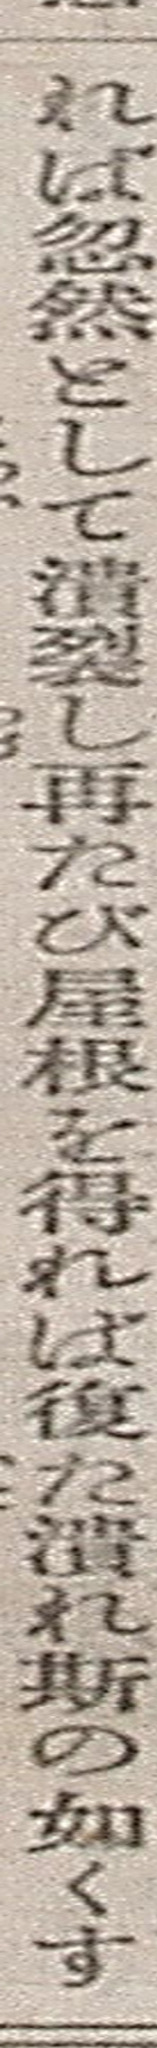れば忽然として潰裂し再たび屋根を得れば復た潰れ斯の如くす
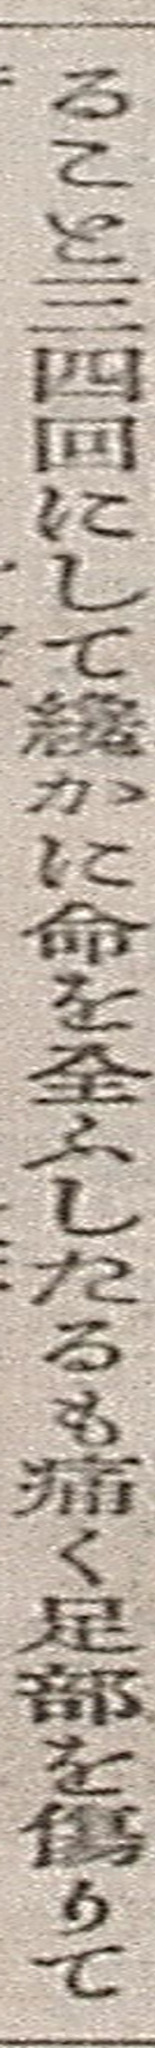ること三四回にして纔かに命を全ふしたるも痛く足部を傷りて
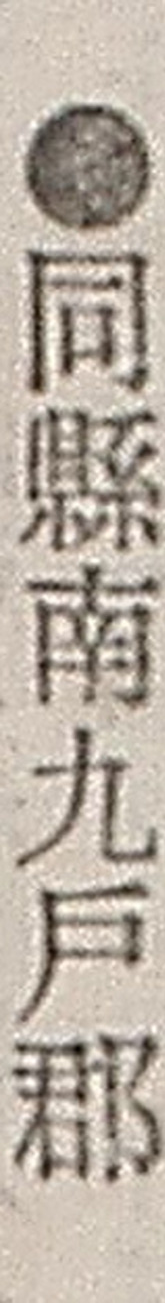●同県南九戸郡
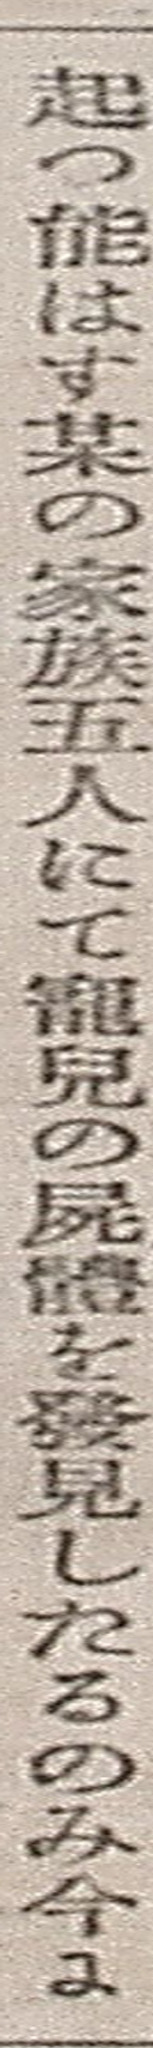起つ能はす某の家族五人にて寵児の屍体を発見したるのみ今に
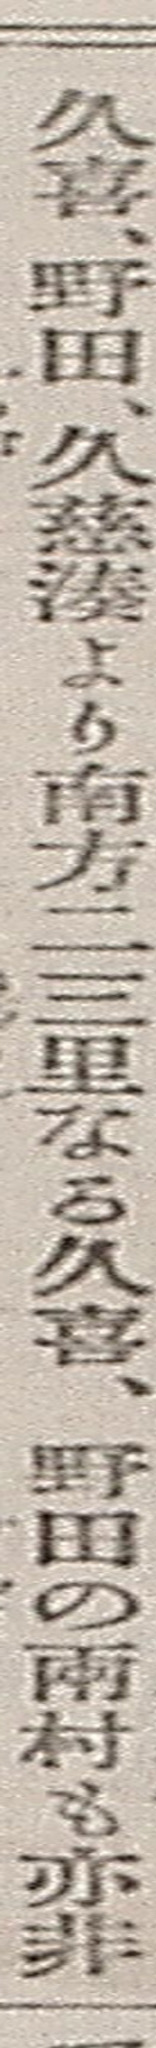久喜、野田、久慈湊より南方ニ三里なる久喜、野田の両村も亦非
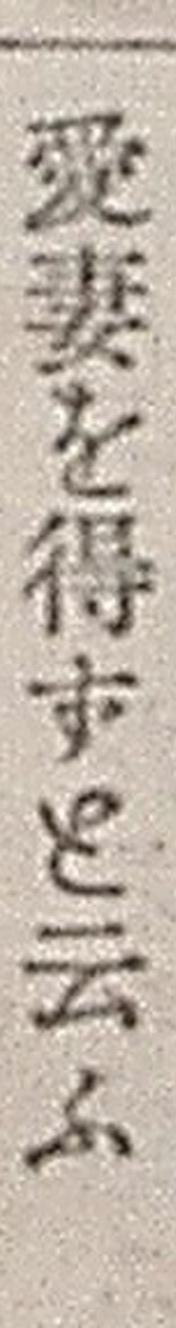愛妻を得ずと云ふ
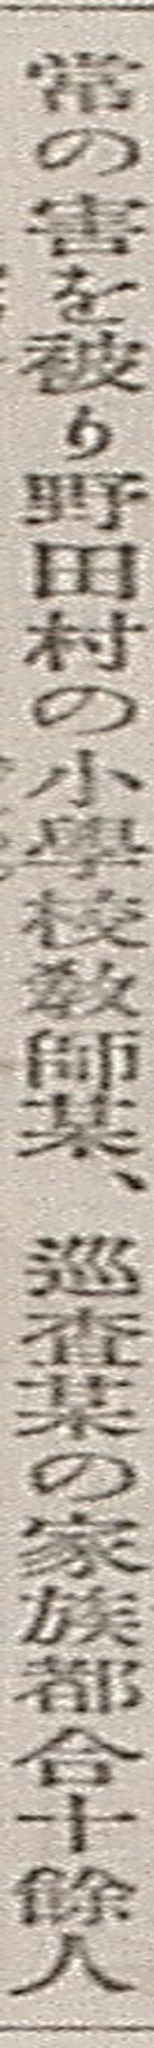常の害を被り野田村の小学校教師某、巡査某の家族都合十余人
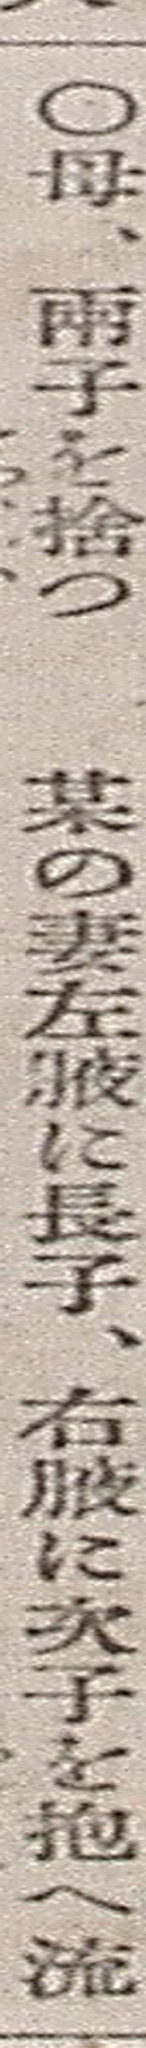〇母、両子を捨つ某の妻左腋に長子、右腋に次子を抱へ流
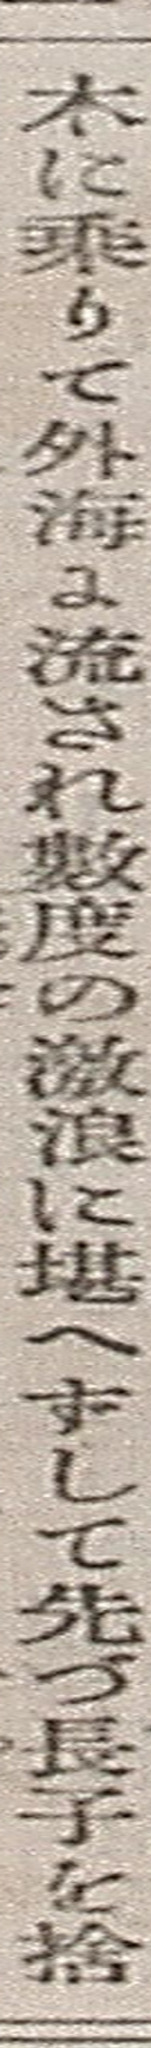木に乗りて外海に流され数度の激浪に堪へずして先づ長子を捨
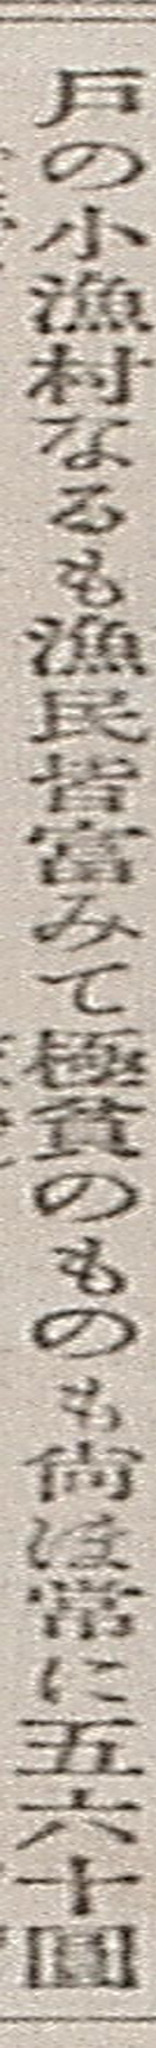戸の小漁村なるも漁民皆富みて極貧のものも尚ほ常に五六十円
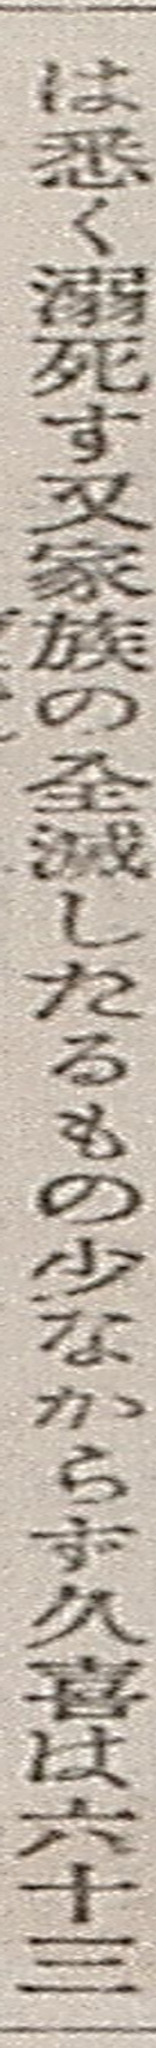は悉く溺死す又家族の全滅したるもの少なからず久喜は六十三
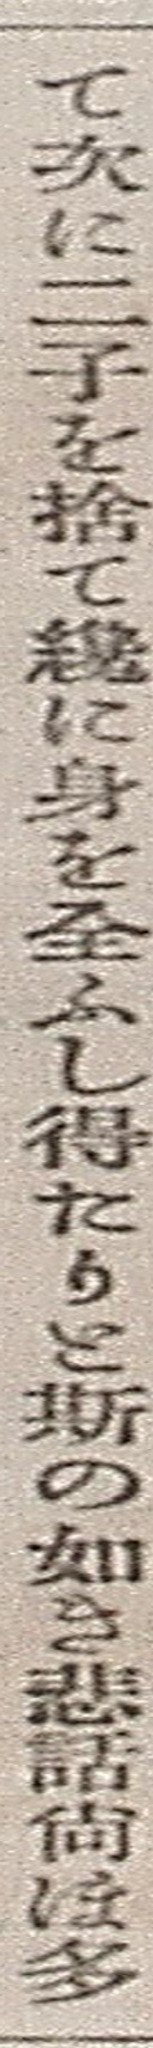て次に二子を捨て纔に身を全ふし得たりと斯の如き悲話尚ほ多
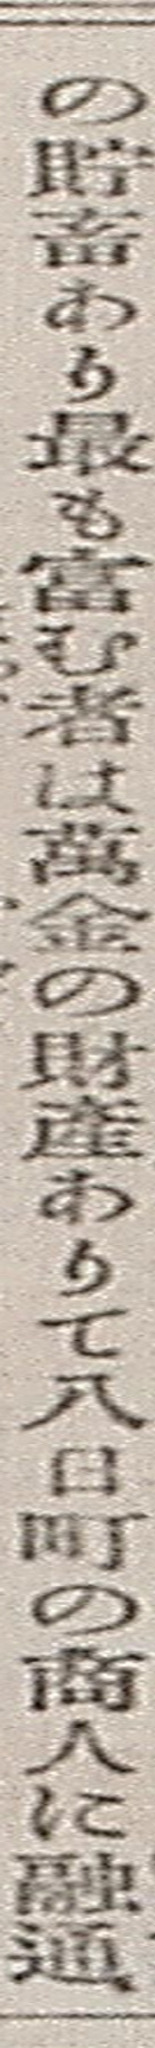の貯蓄あり最も富む者は万金の財産ありて八日町の商人に融通
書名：風俗畫報臨時増刊第百十九號　大海嘯被害録（中）
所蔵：東京大学地震研究所図書室 Earthquake Research Institute Library, The University of Tokyo, JAPAN
